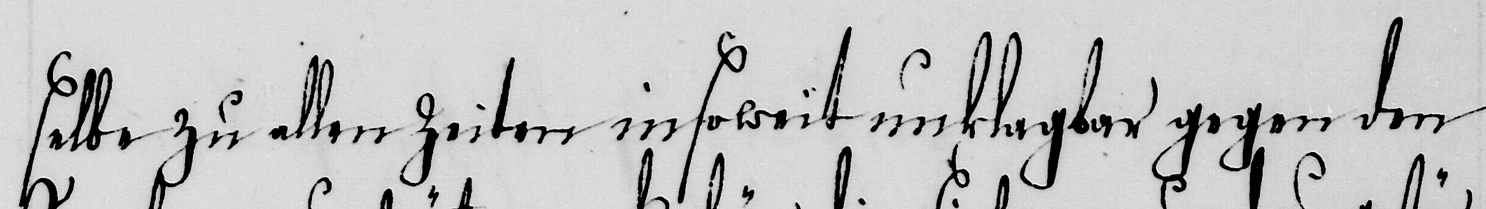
selbe zu allen Zeiten insoweit unklagbar gegen den
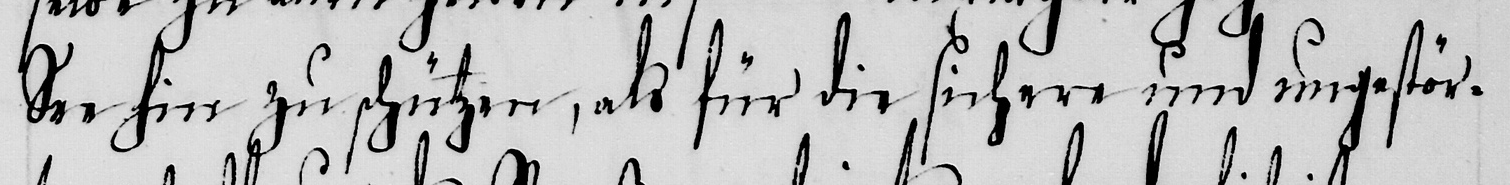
See hin zu schützen, als für die sichere und ungestör¬
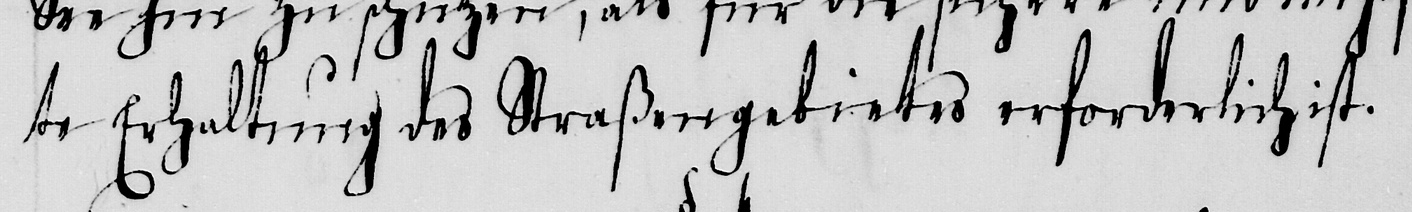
te Erhaltung des Straßengebietes erforderlich ist.
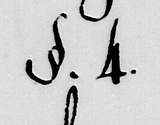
§. 4.
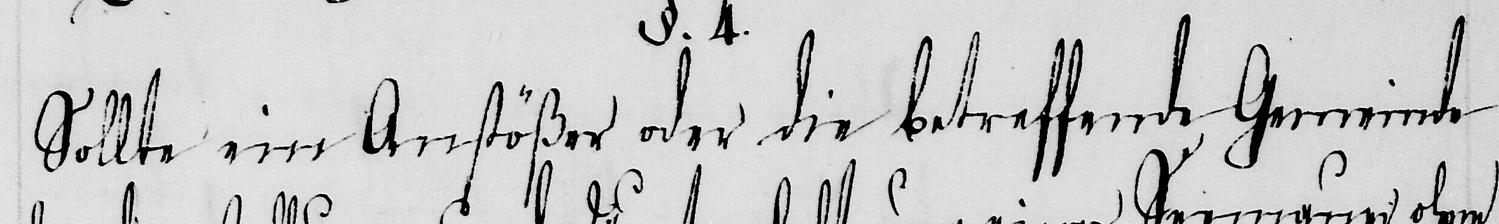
Sollte ein Anstößer oder die betreffende Gemeinde
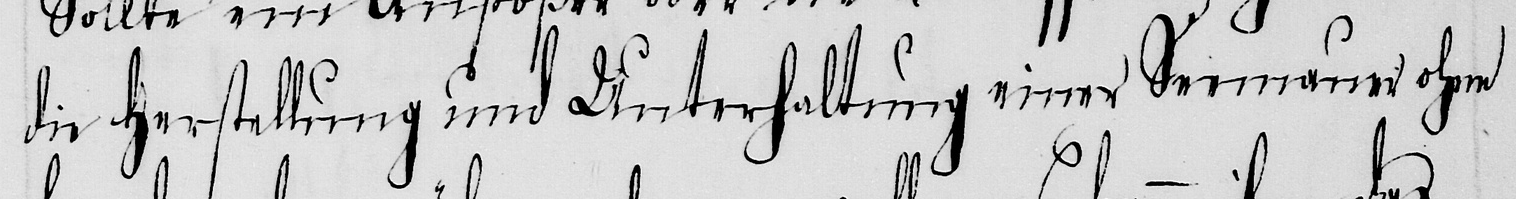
die Herstellung und Unterhaltung einer Seemauer ohne
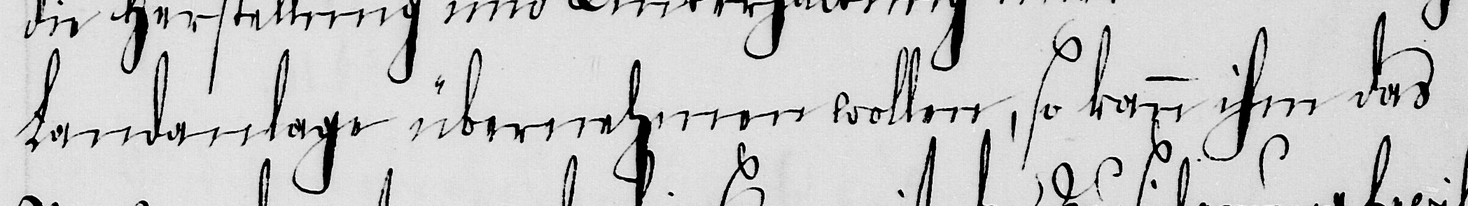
Landanlage übernehmen wollen, so kann ihm das
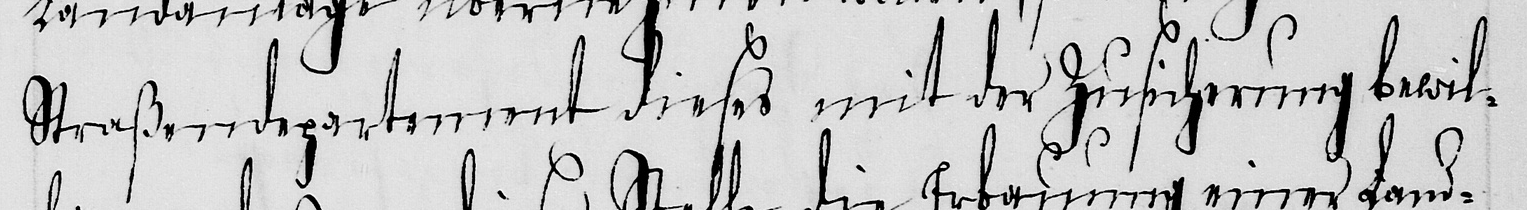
Straßendepartement dieses mit der Zusicherung bewil¬
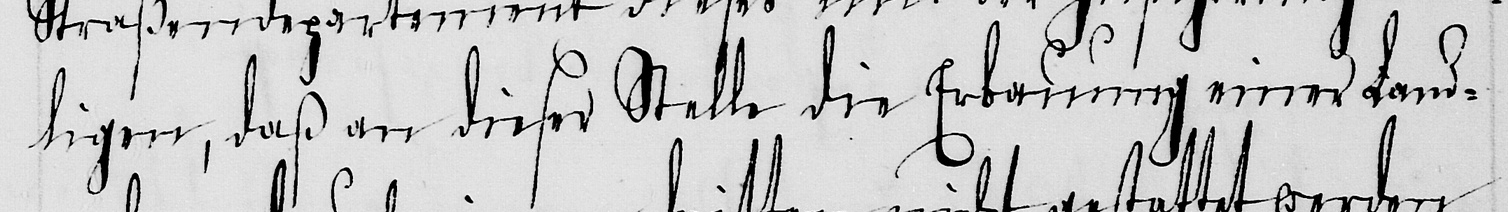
ligen, daß an dieser Stelle die Erbauung einer Land¬
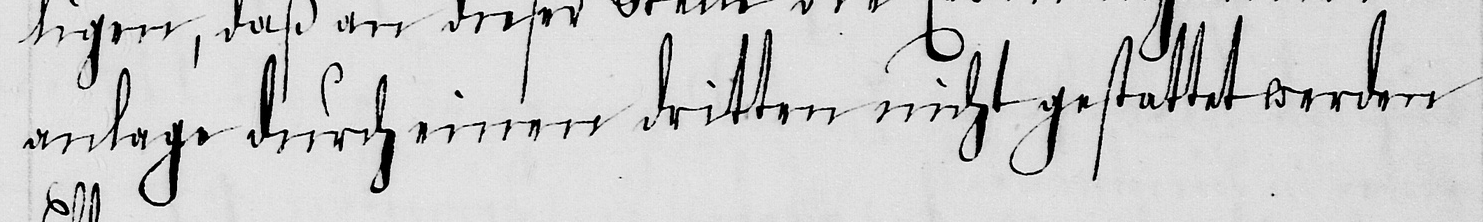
anlage durch einen dritten nicht gestattet werden
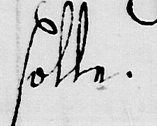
solle.
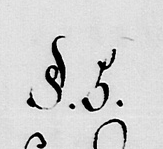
§. 5.
